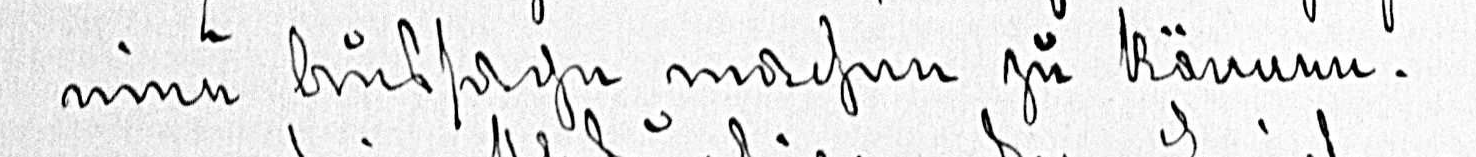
eine Aussage machen zu können.
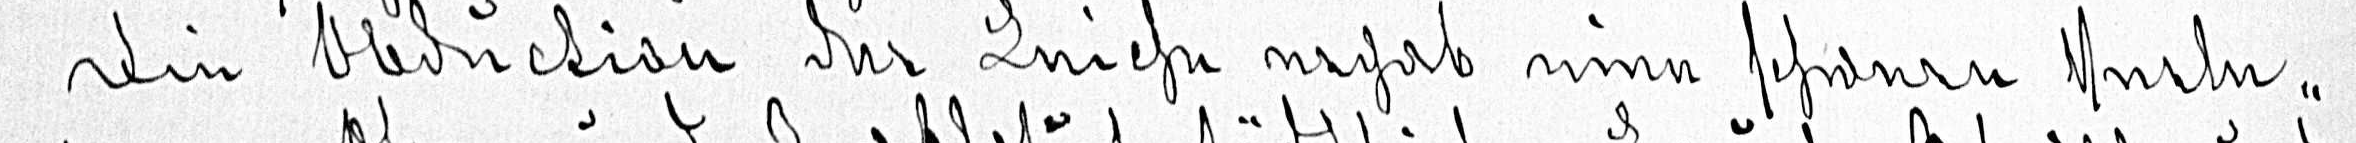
Die Obduktion der Leiche ergab eine schwere Verle¬
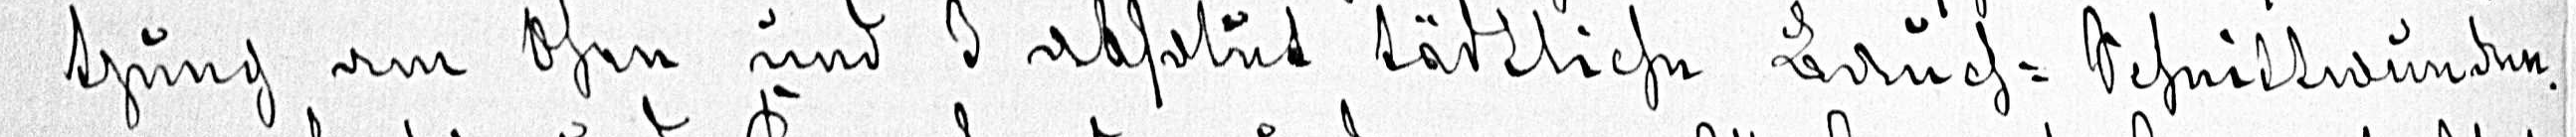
tzung am Ohre und 3 absolut tödtliche Bauch-Schnittwunden.
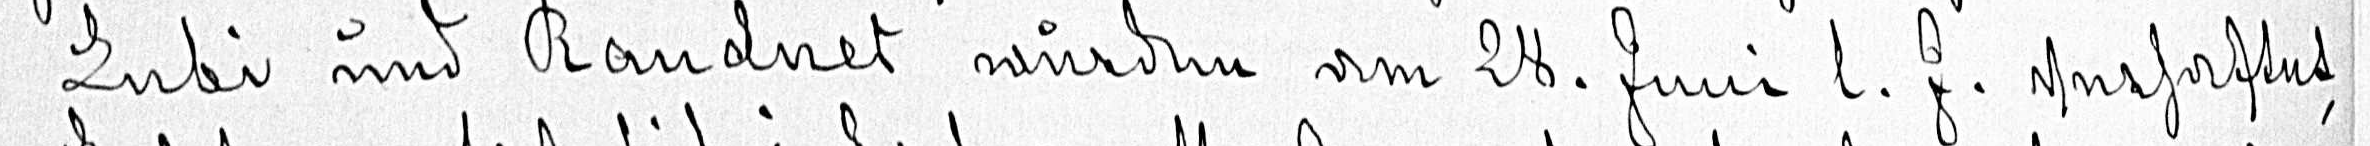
Lubi und Raudner wurden am 28. Juni l. J. verhaftet,
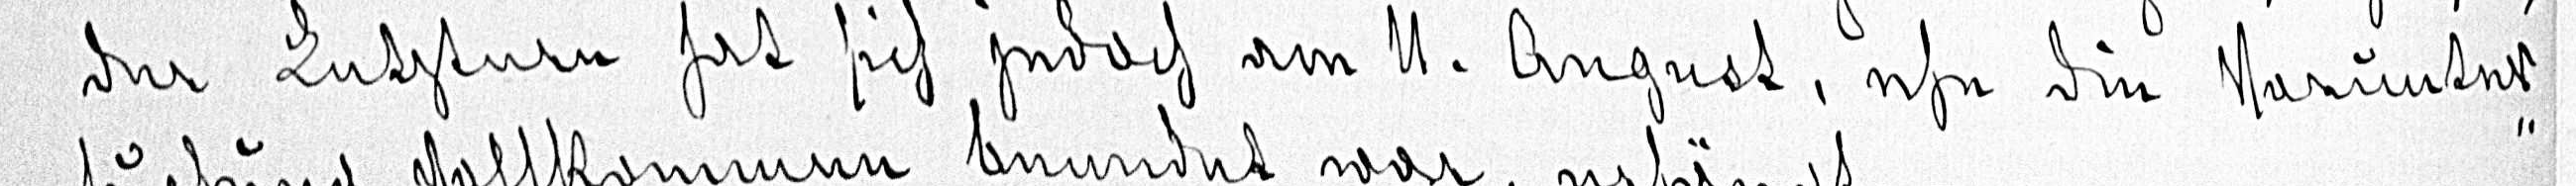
der Letztere hat sich jedoch am 11. August, ehe die Vorunter¬
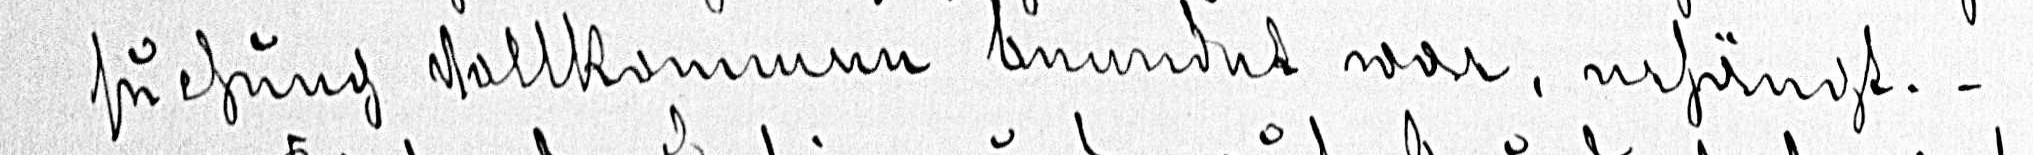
suchung vollkommen beendet war, erhängt.
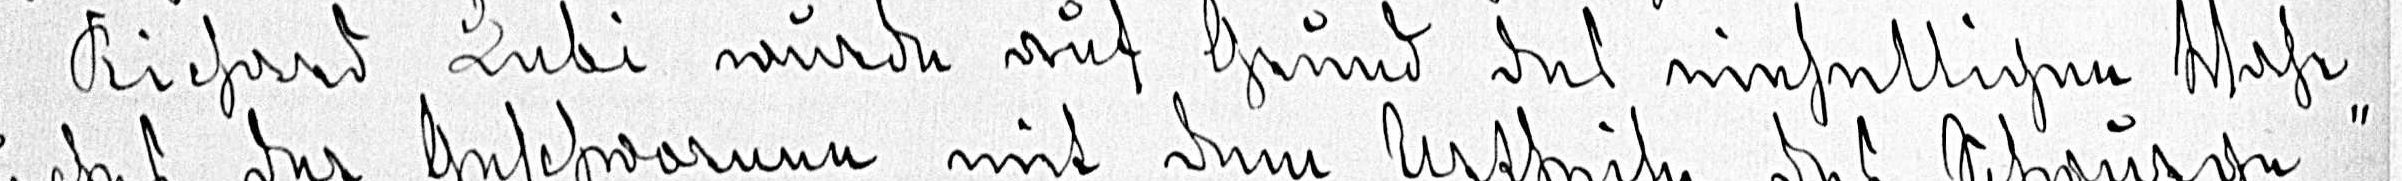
Richard Lubi wurde auf Grund des einhelligen Wahr¬
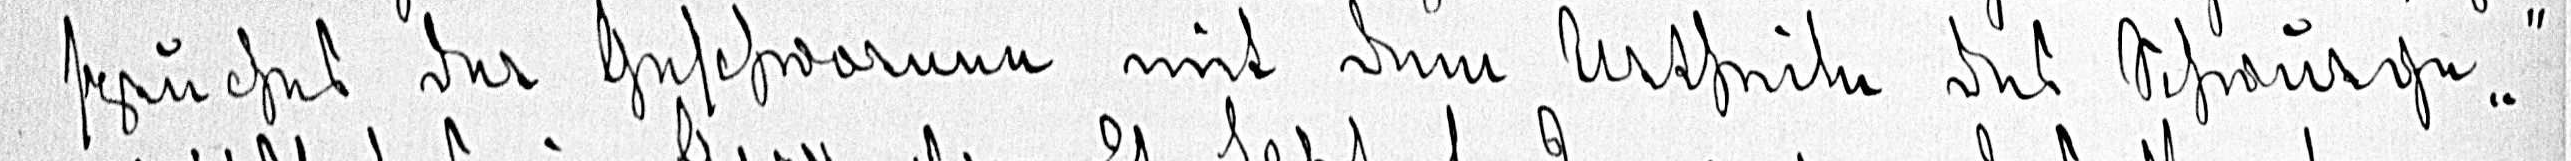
spruches der Geschworene mit dem Urtheile des Schwurge¬
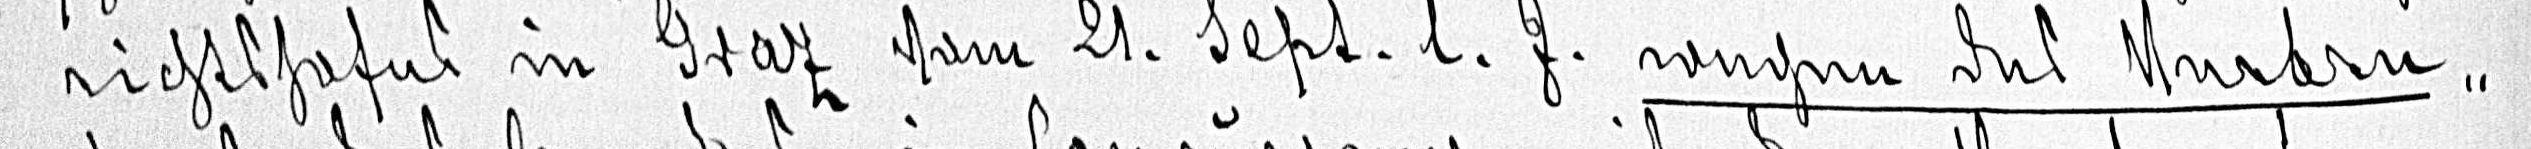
richtshofes in Graz vom 21. Sept. l. J. wegen des Verbre¬
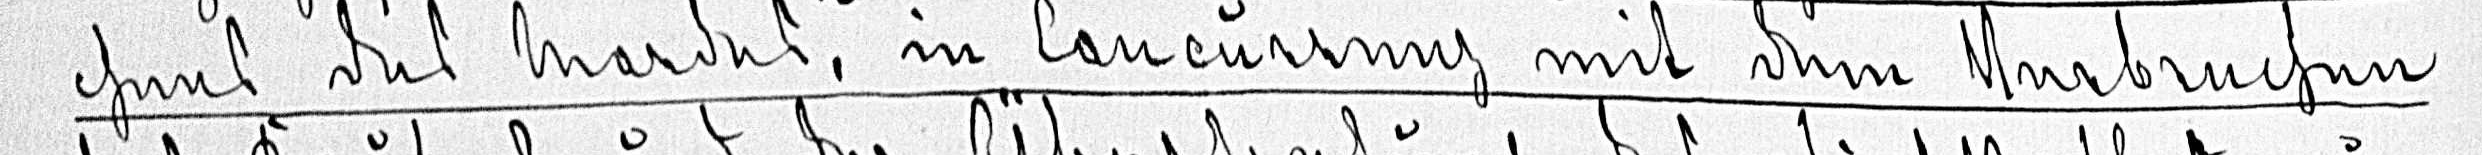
chens des Mordes, in Concurrenz mit dem Verbrechen
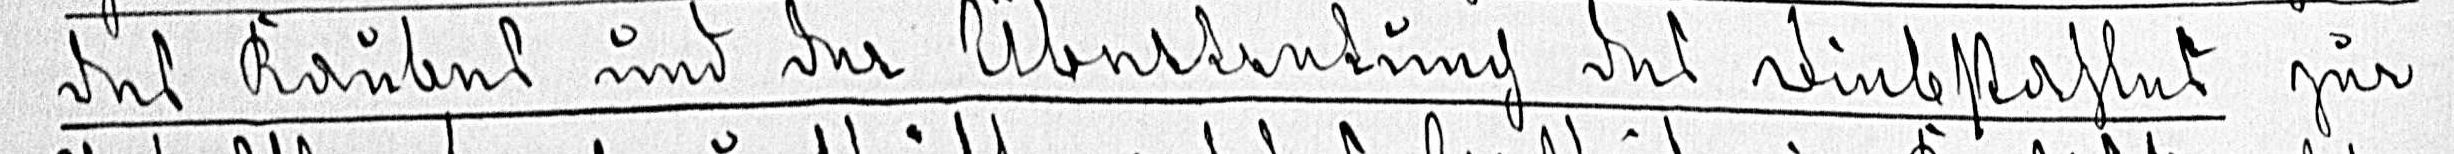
des Raubes und der Übertretung des Diebstahles zur
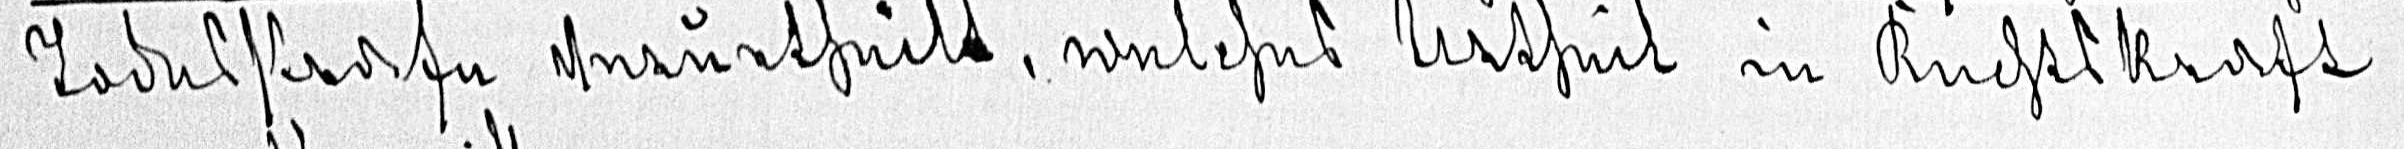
Todesstrafe verurtheilt, welches Urtheil in Rechtskraft
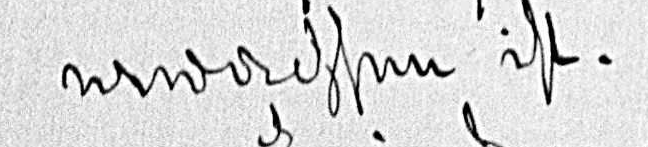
erwachsen ist.
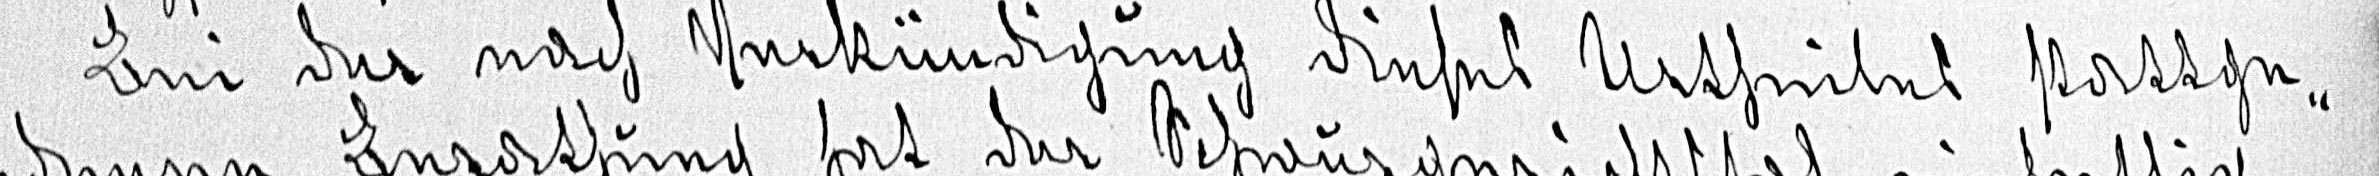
Bei der nach Verkündigung dieses Urtheiles stattge¬
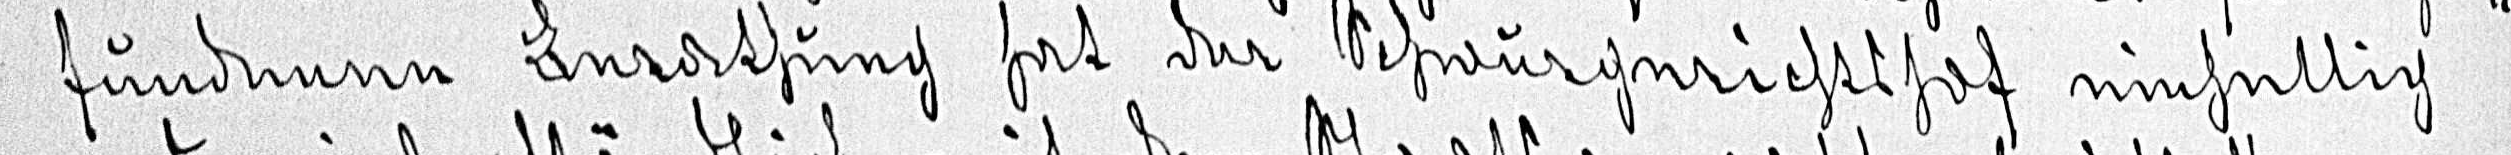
fundenen Berathung hat der Schwurgerichtshof einhellig
